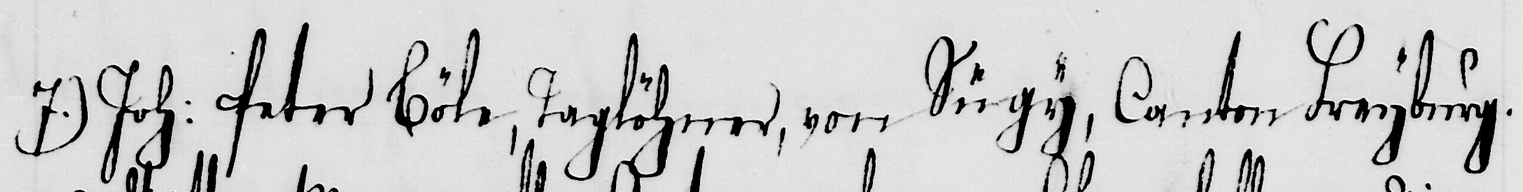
7.) Joh: Peter Böle, Taglöhner, von Sügy, Canton Freyburg.
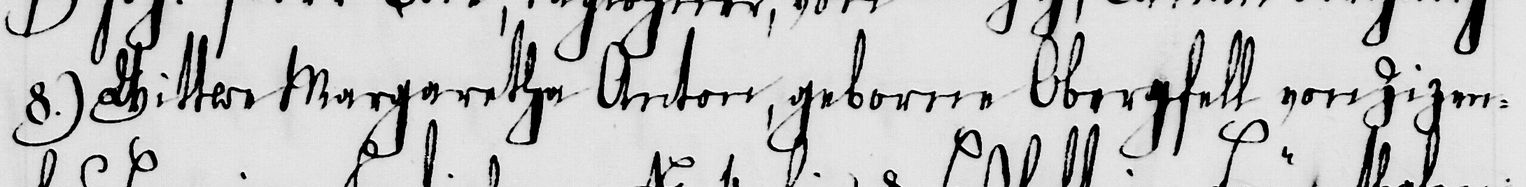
8.) Wittwe Margaretha Anton, geborne Obergfell von Zizen¬
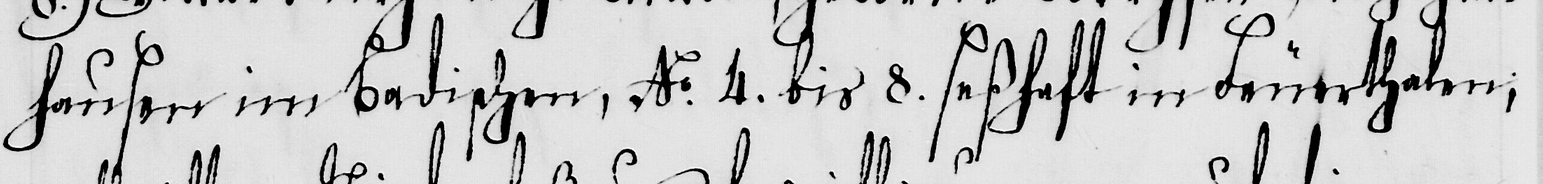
hausen im Badischen, No. 4. bis 8. seßhaft in Feuerthalen;
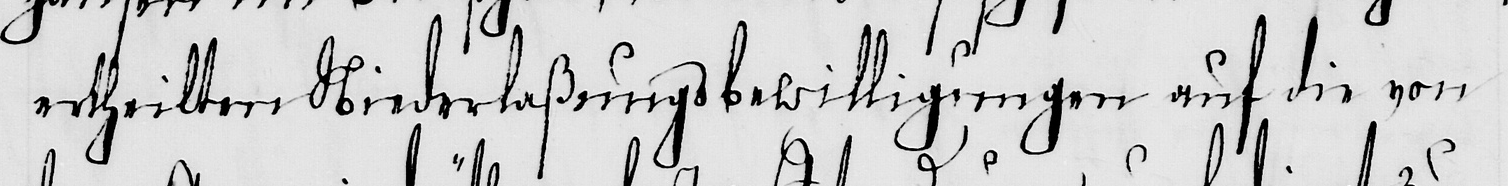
erhteilten Niederlaßungsbewilligungen auf die von
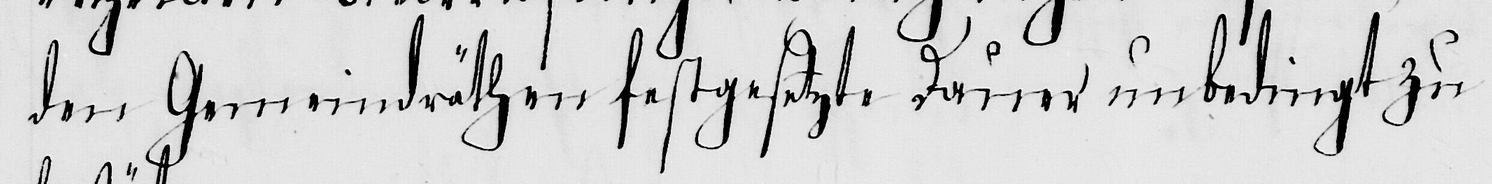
den Gemeindräthen festgesetzte Dauer unbedingt zu
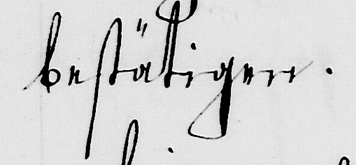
bestätigen.
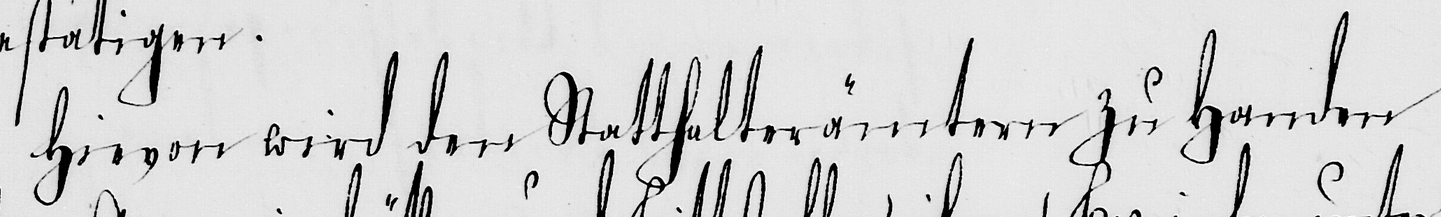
Hievon wird den Statthalterämtern zu Handen
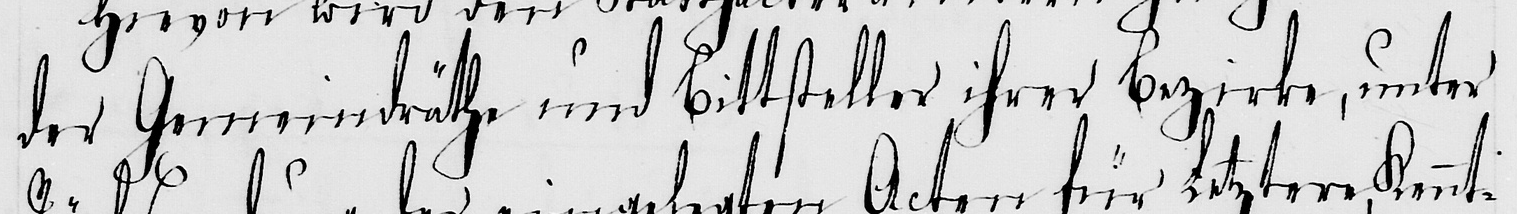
der Gemeindräthe und Bittsteller ihrer Bezirke, unter
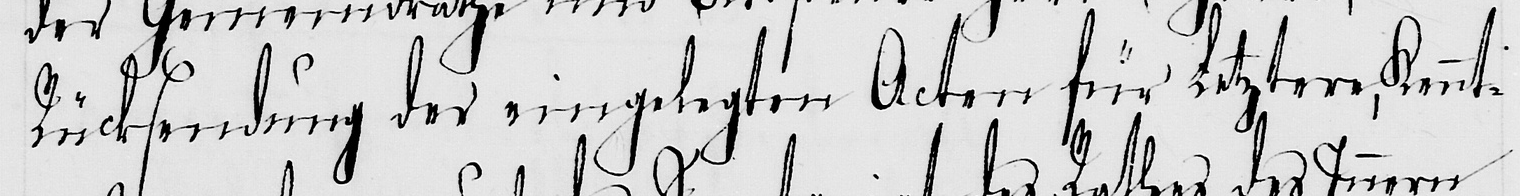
Rücksendung der eingelegten Acten für Letztere, Kenn¬
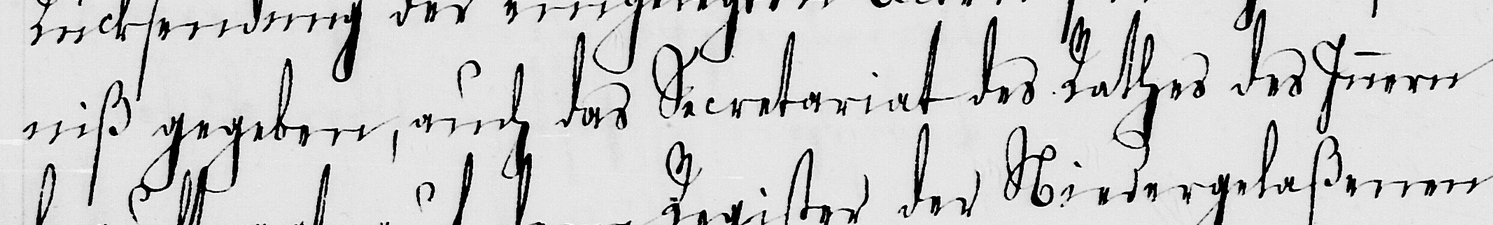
tniß gegeben, auch das Secretariat des Rathes des Innern
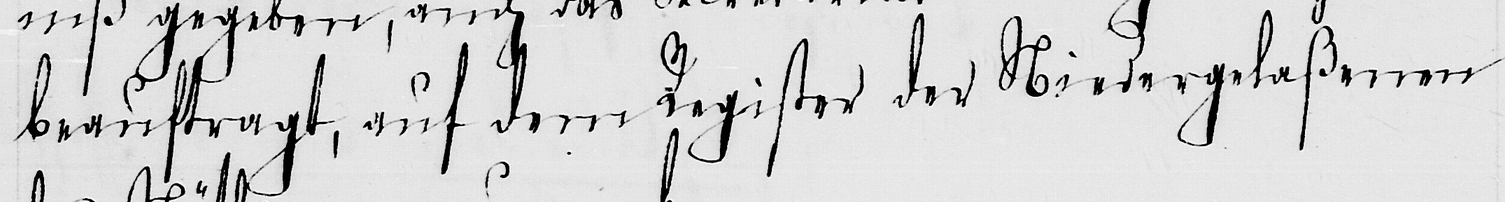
beauftragt, auf dem Register der Niedergelaßenen
